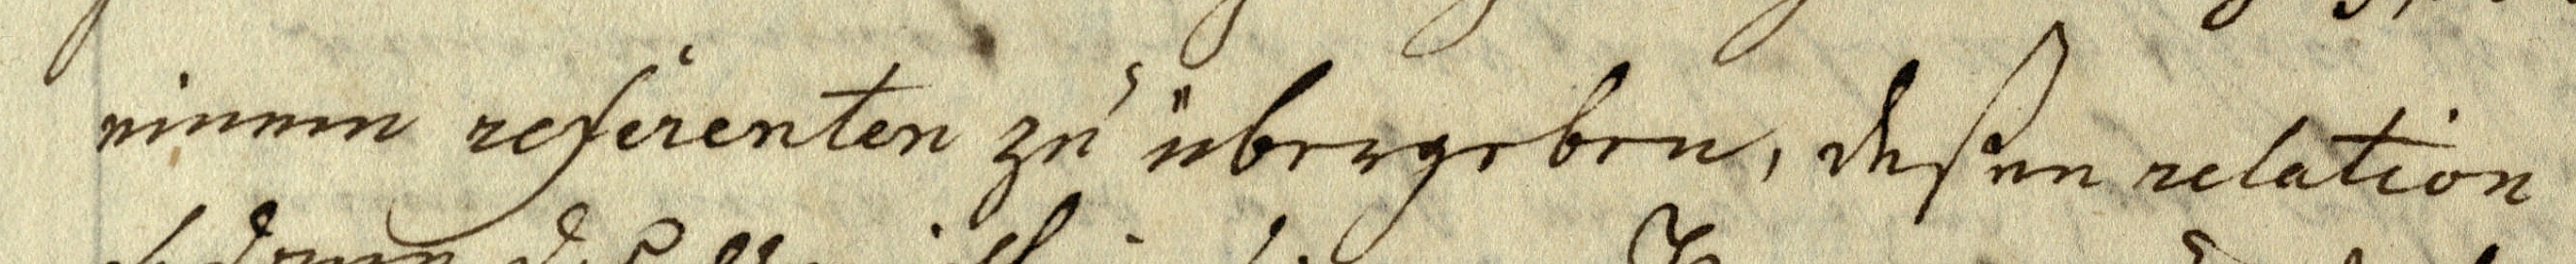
einem referenten zu übergeben, deßen relation
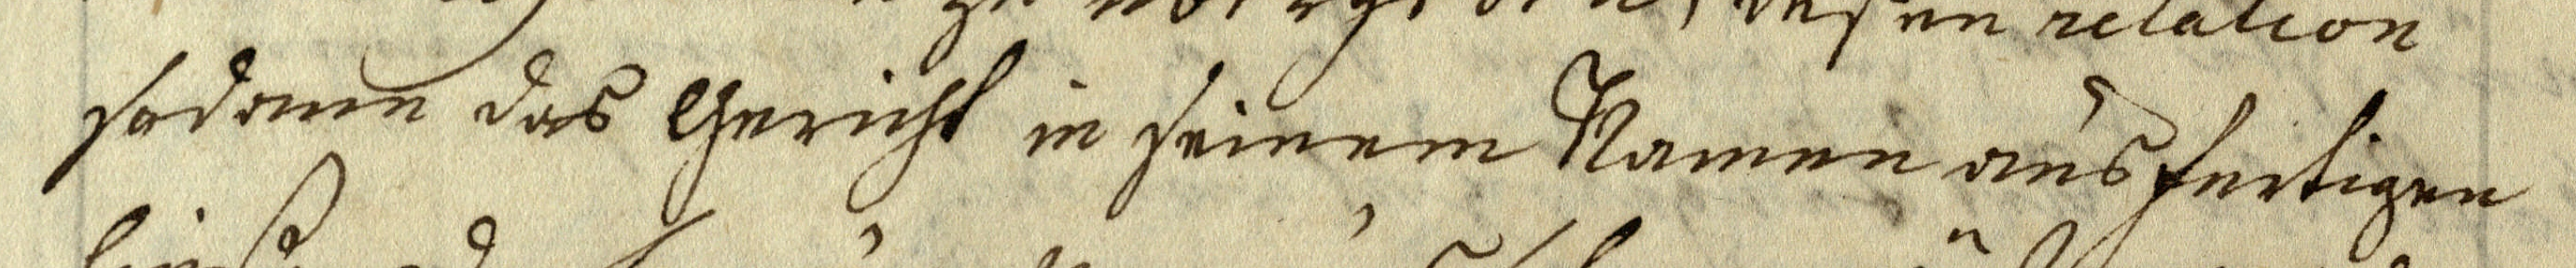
sodann das Gericht in seinem Namen ausfertigen
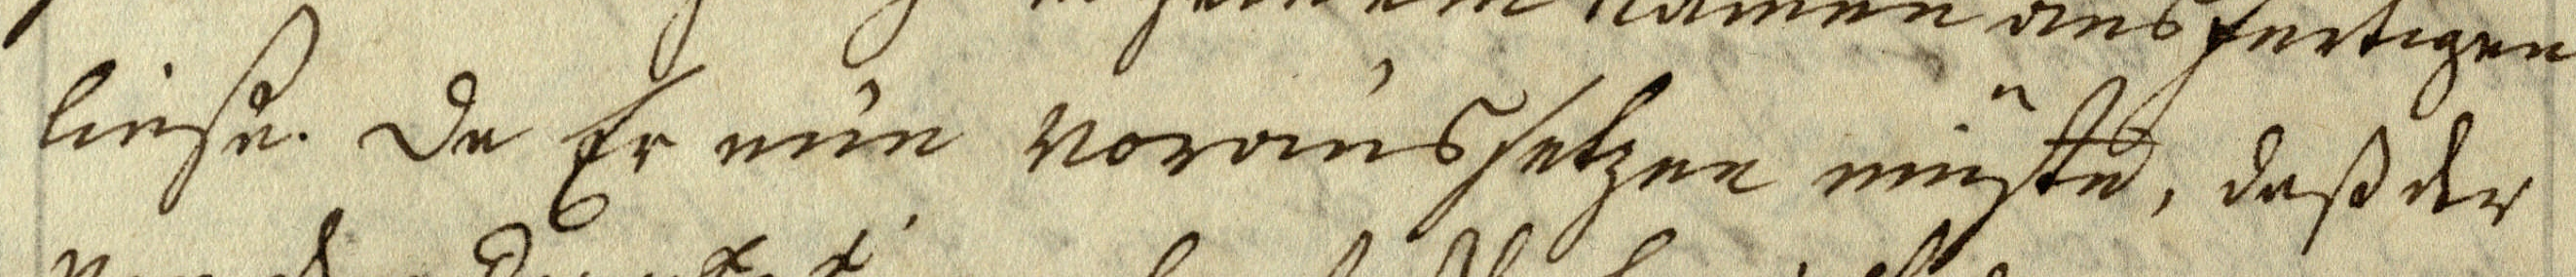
ließe. da Er nun voraussetzen müste, daß der
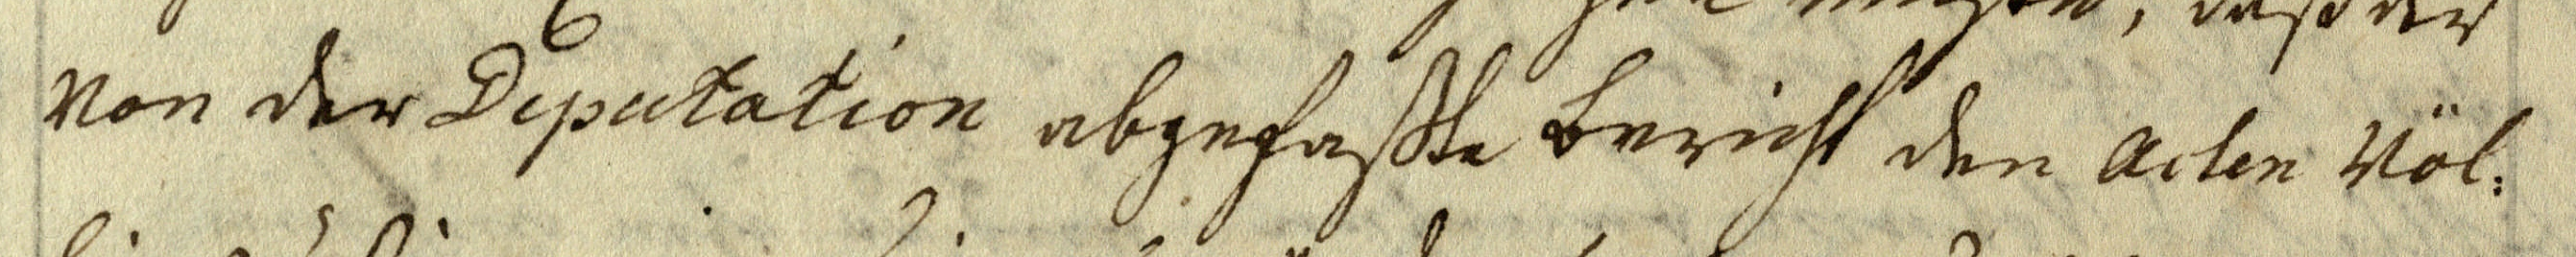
von der Deputation abgefaßte Bericht den Acten völ¬
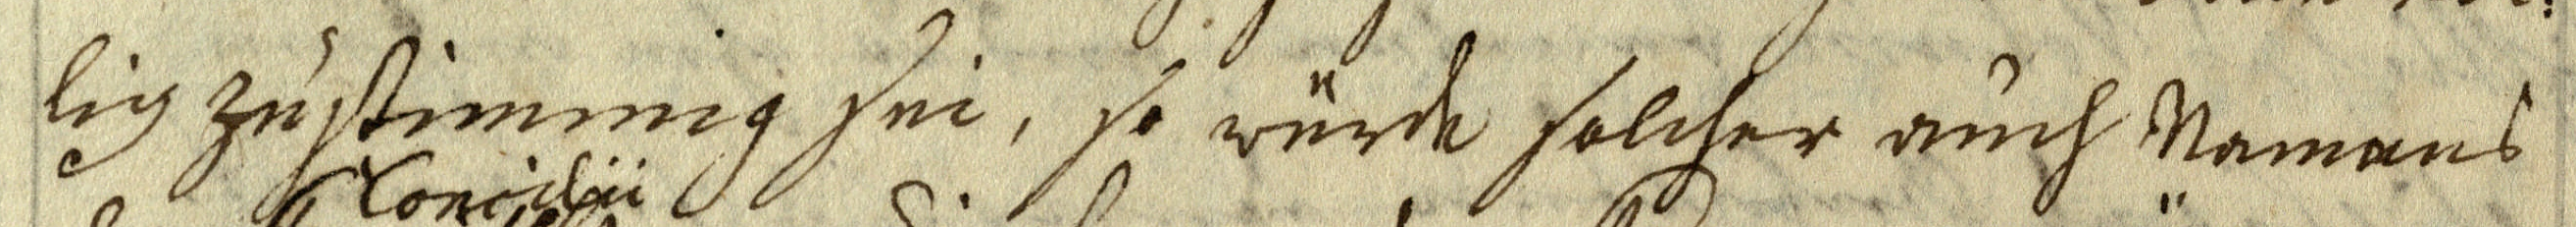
lig zustimmig sei, so würde solcher auch Namens
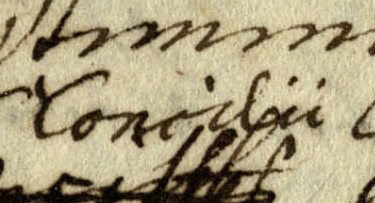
Concilii
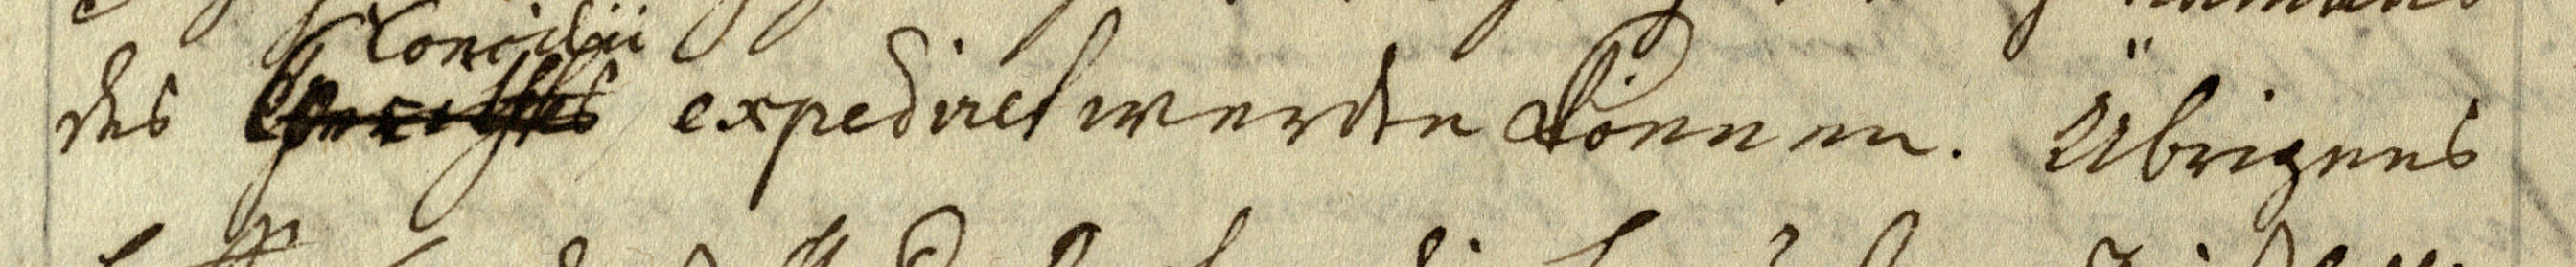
des Gerichtes expediret werden können. Übrigens
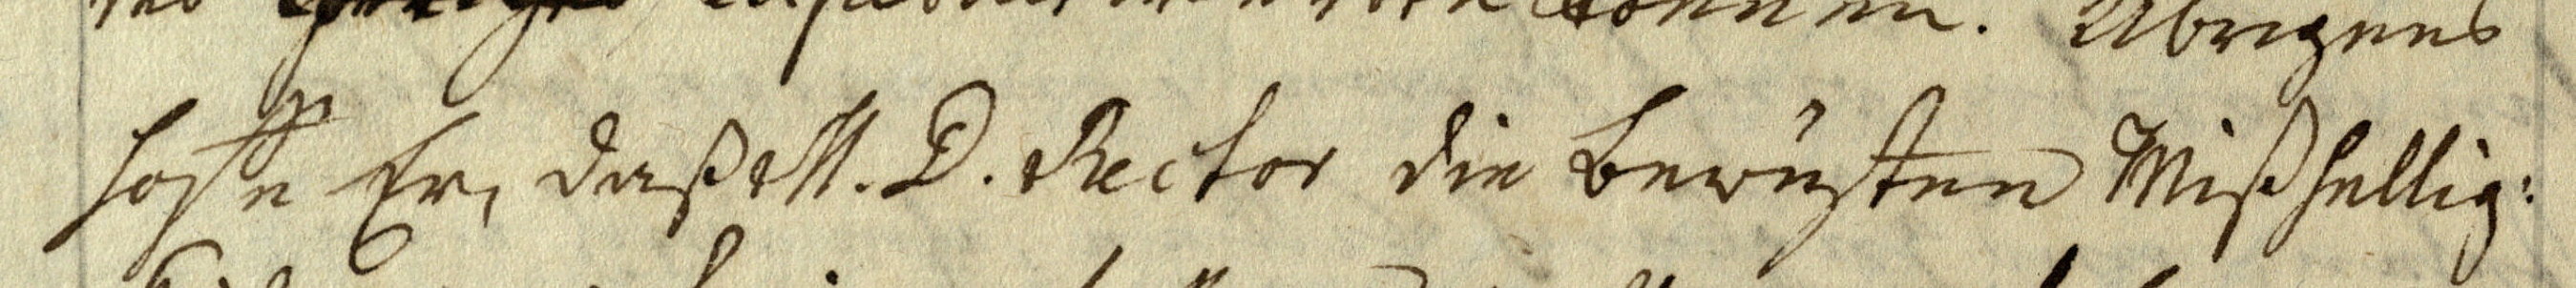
hoffe Er, daß M. D. Rector die bewusten Mißhellig¬
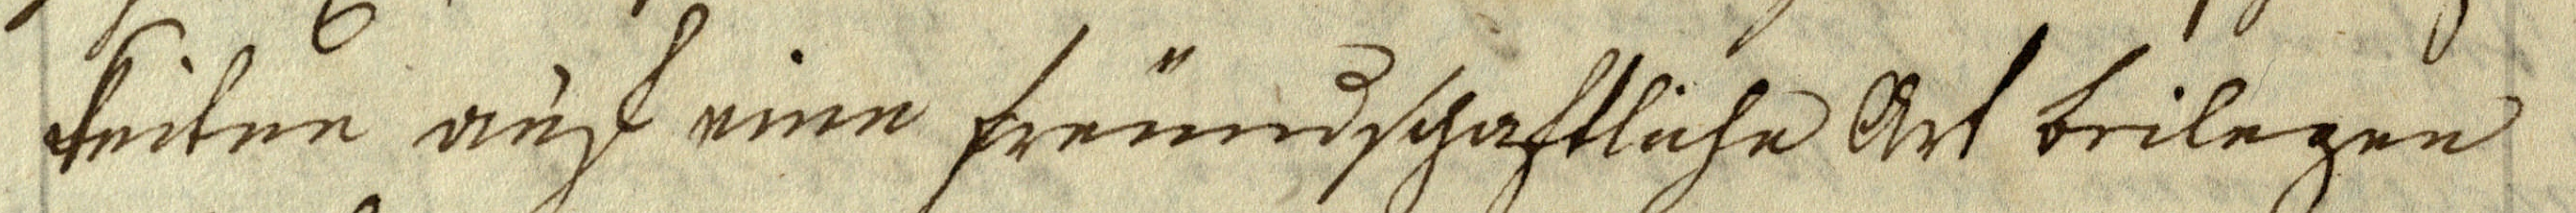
keiten auf eine freundschaftliche Art beilegen
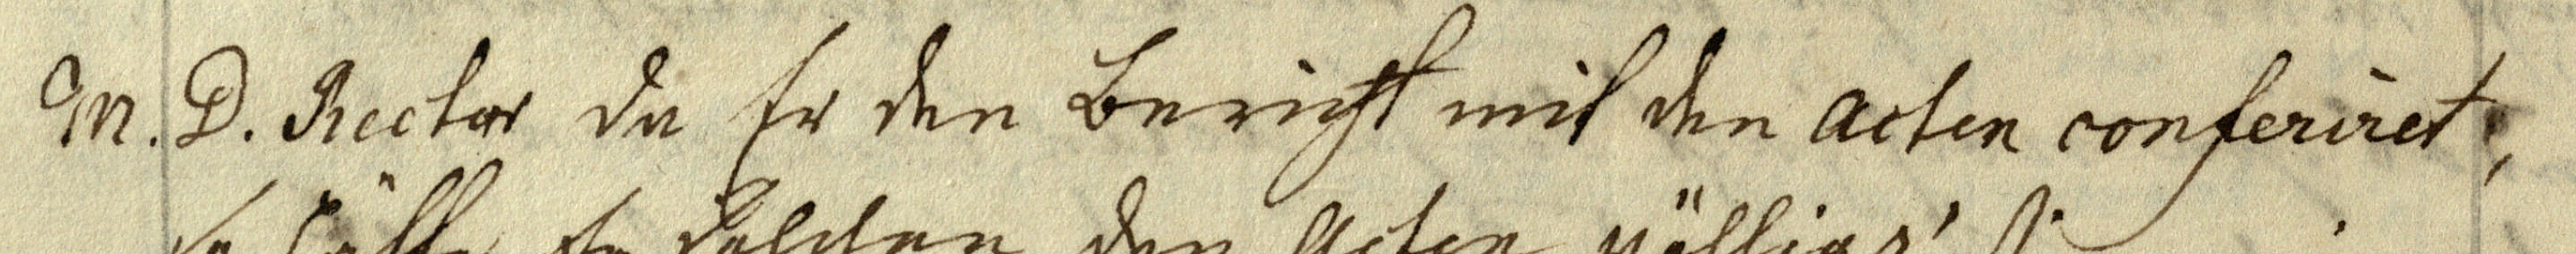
M. D. Rector da Er den Bericht mit den Acten conferiret,
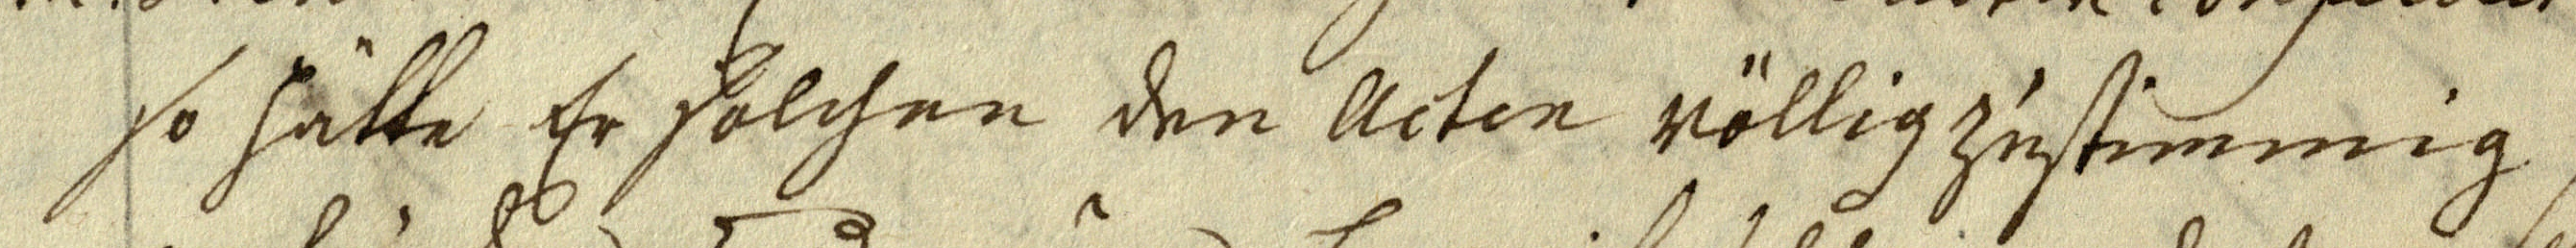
so hätte Er solchen den Acten völlig zustimmig
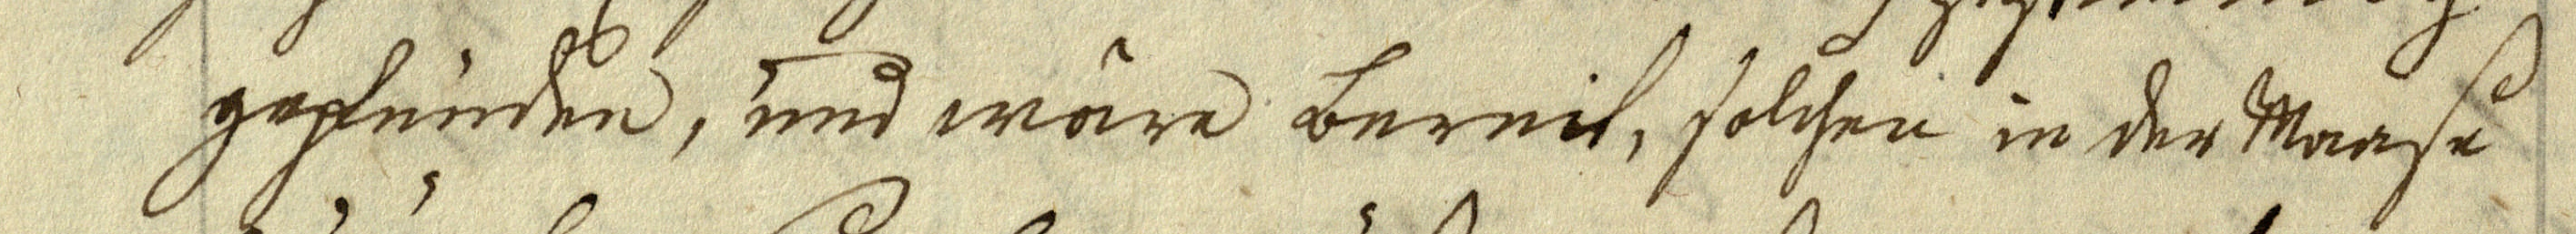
gefunden, und wäre bereit, solchen in der Maaße
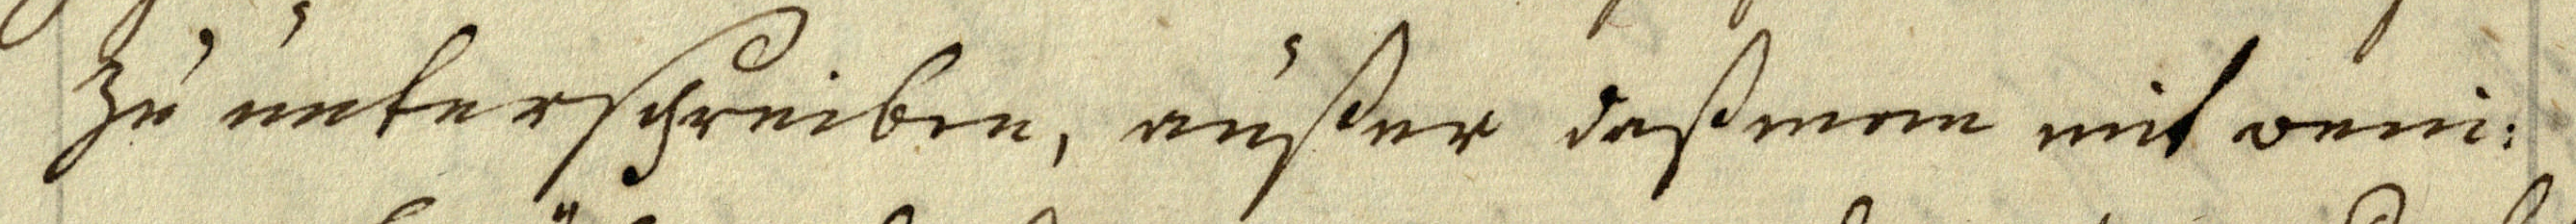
zu unterschreiben, außer daß man mit weni¬
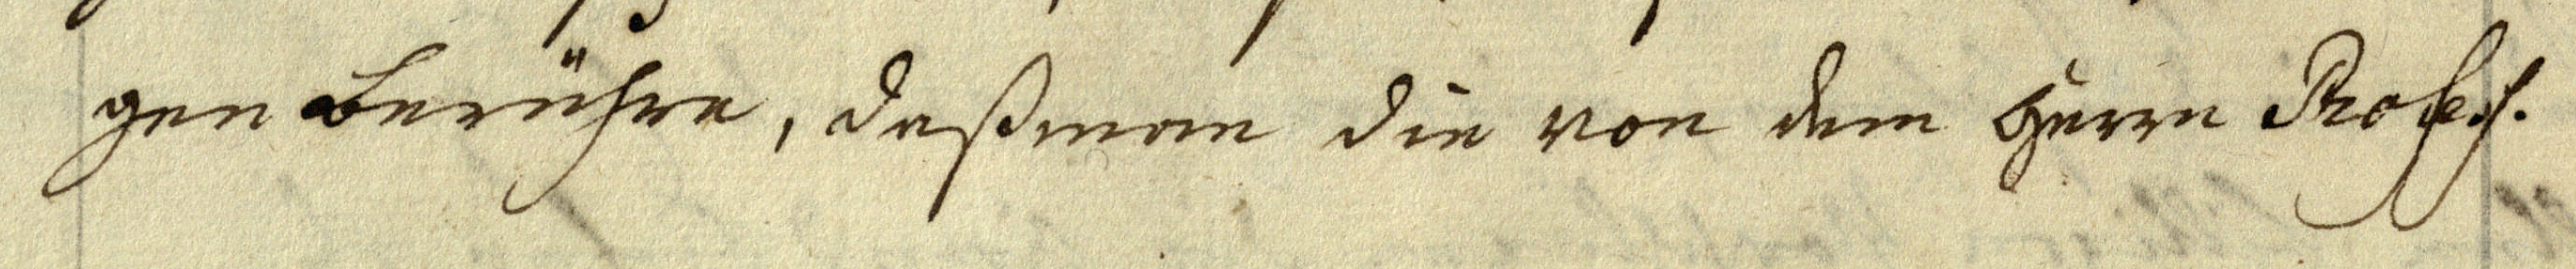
gen berühre, daß man die von dem Herrn Profes
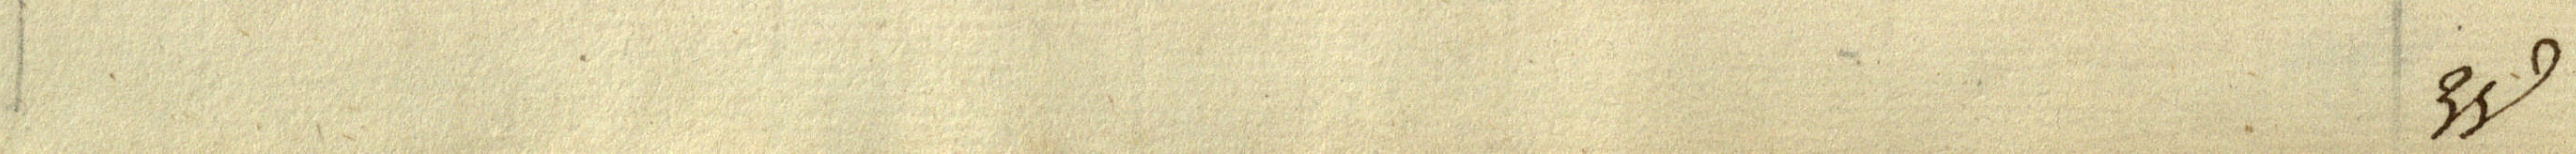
s
